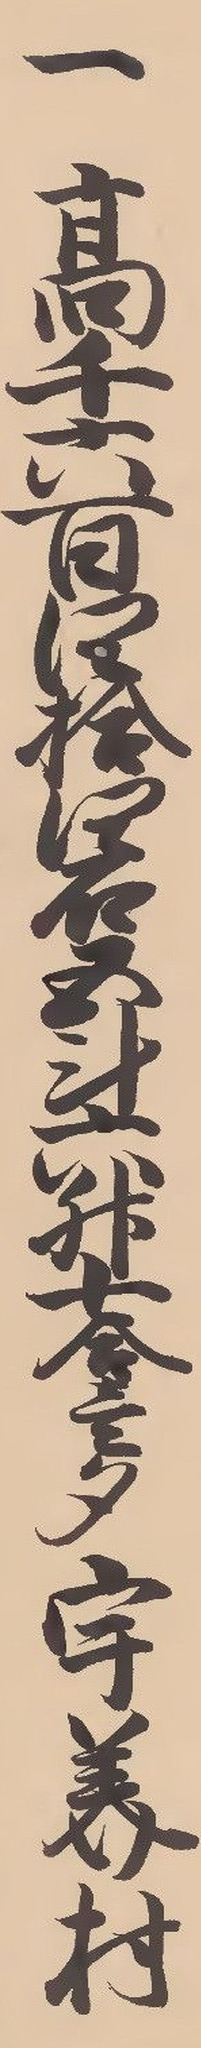一高千六百四拾四石五斗六升七合壱勺宇美村
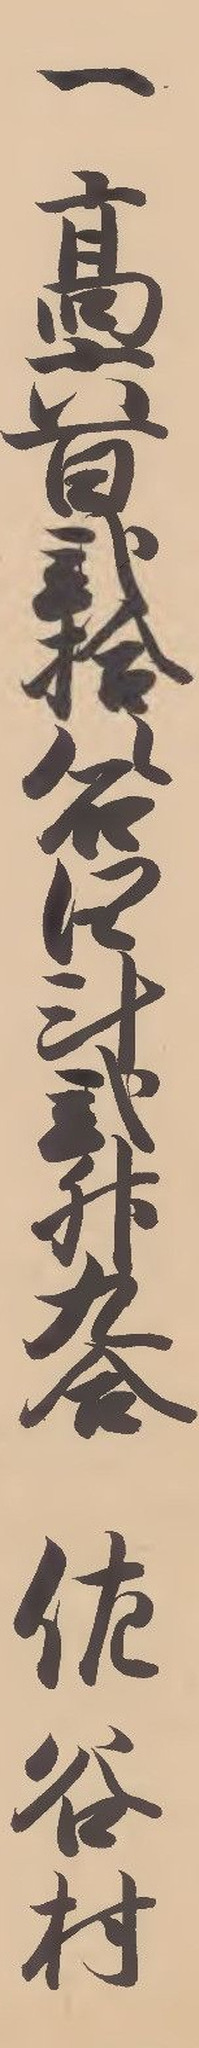一高六百弐拾八石四斗弐升九合佐谷村
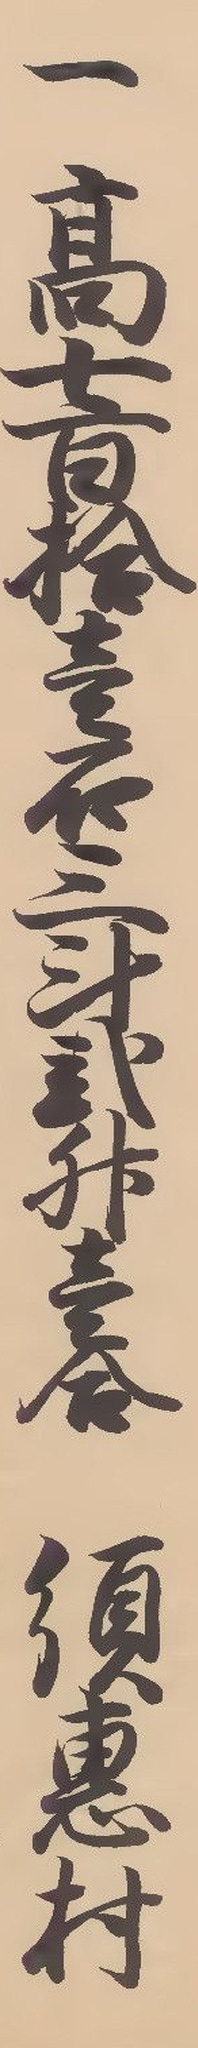一高七百拾壱石三斗弐升壱合須恵村

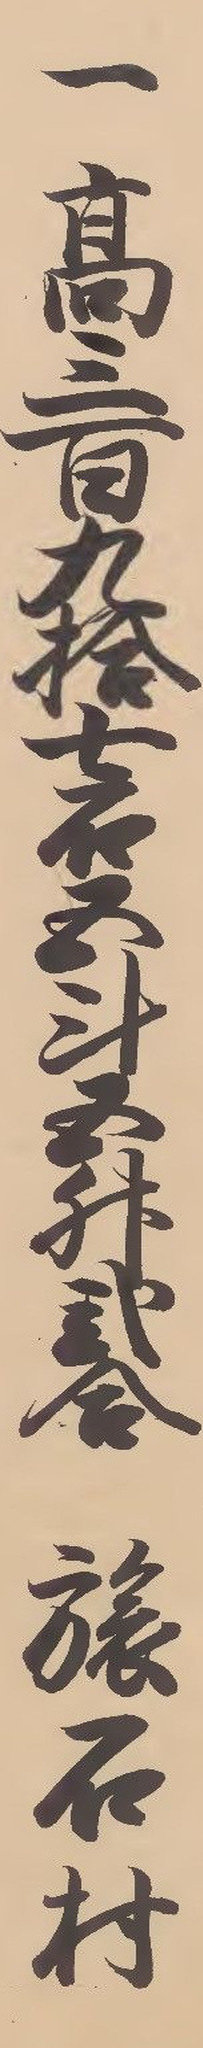一高三百九拾七右五斗五升弐合旅石村
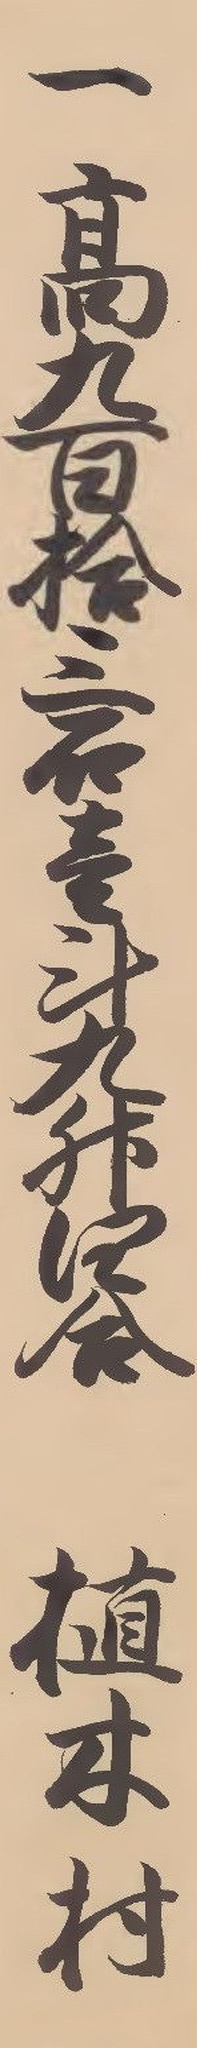一高九百拾三石壱斗九升四合植木村
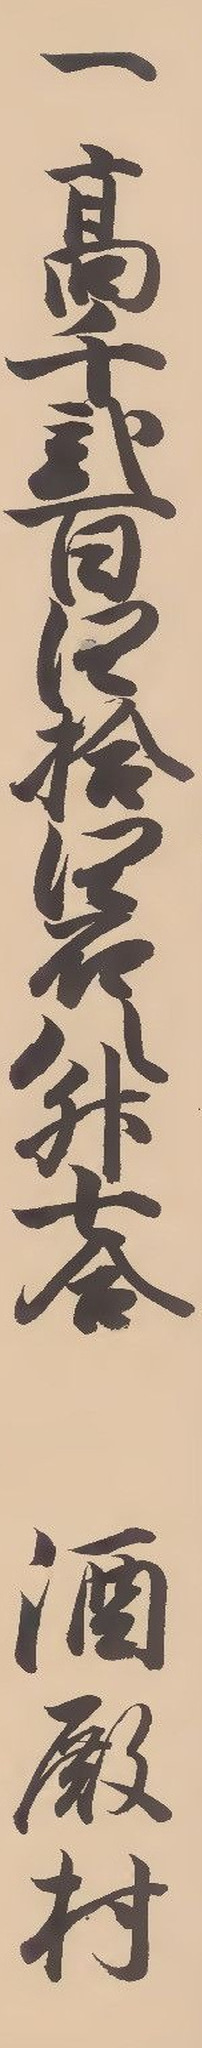一高千弐百四拾四石八升七合酒殿村
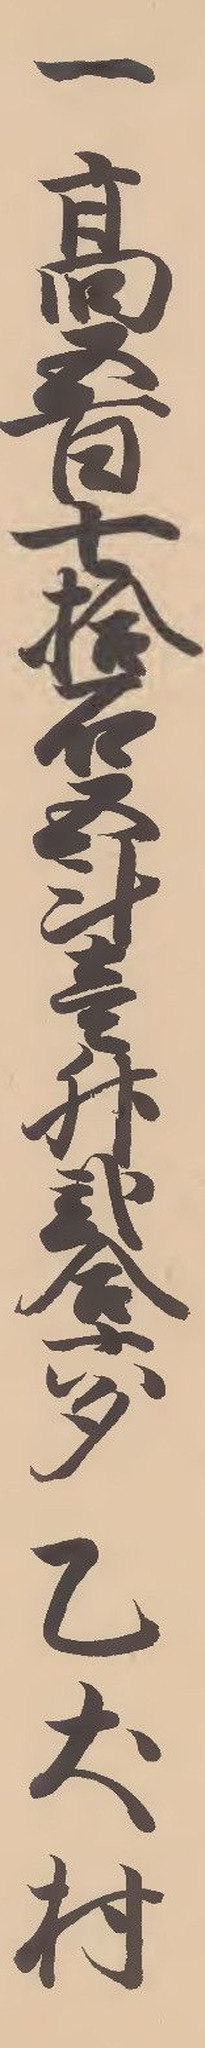一高五百七拾石五斗壱升弐合六勺乙犬村
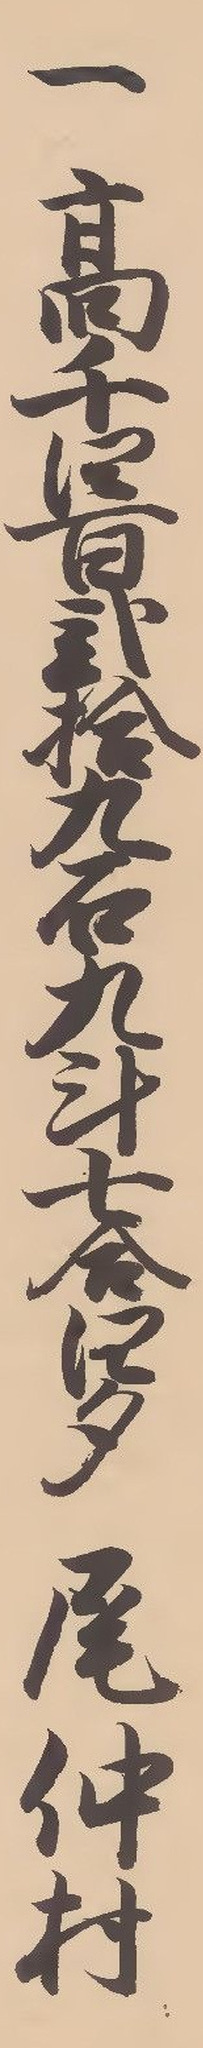一高千四百弐拾九石九斗七合四勺尾仲村
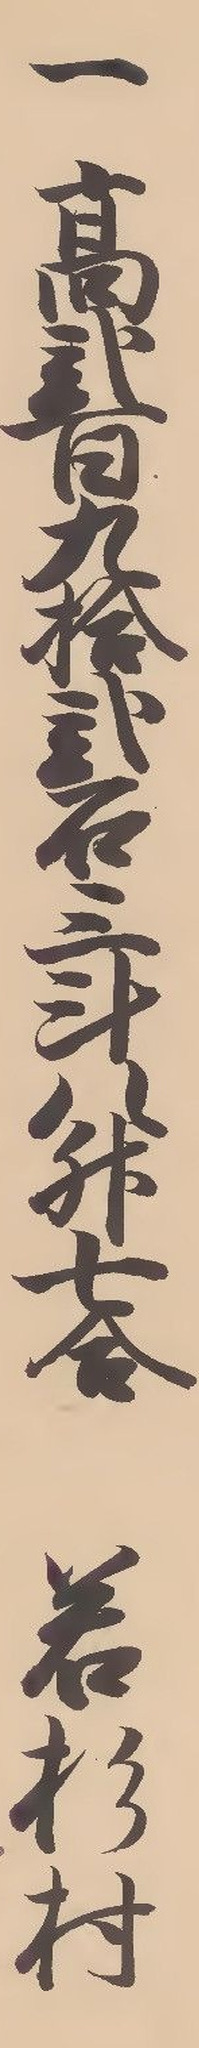一高弐百九拾弐石三斗八升七合若杉村

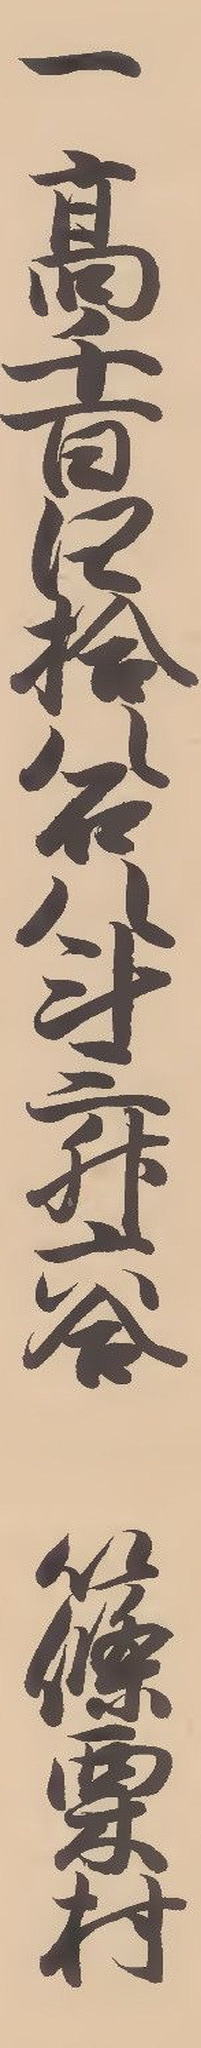一高千百四拾八石八斗三升六合篠栗村
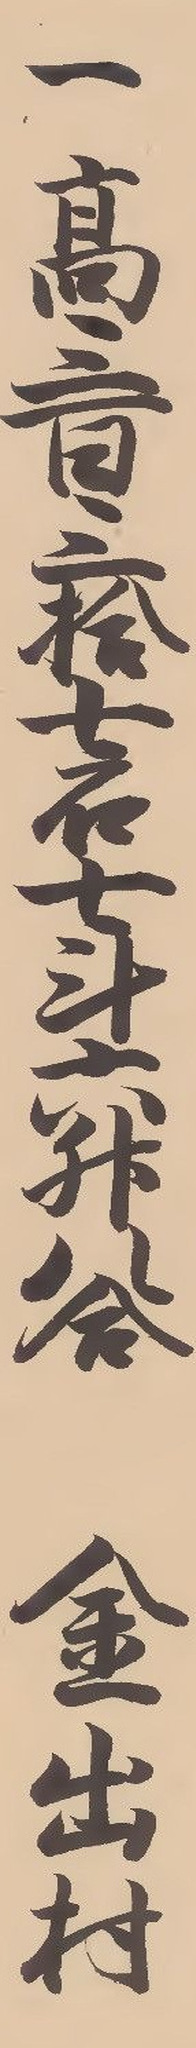一高三百三拾七右七斗六升八合金出村
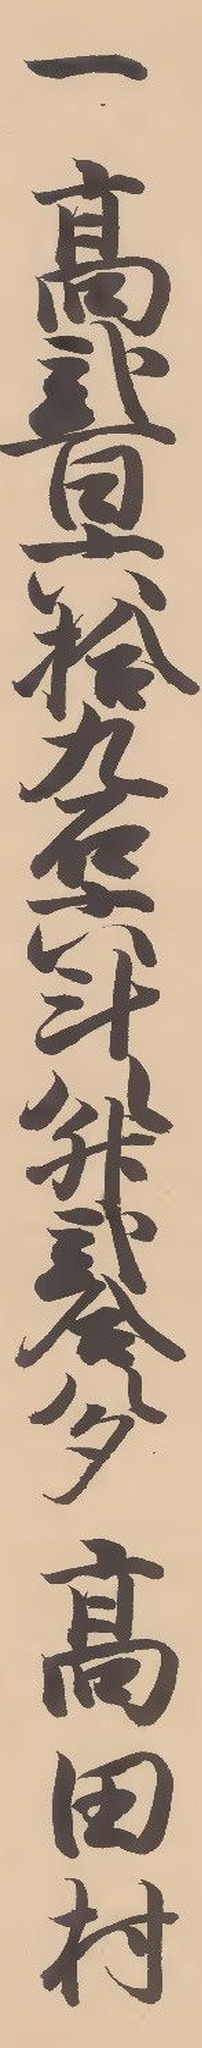一高弐百六拾九石六斗八升弐合八勺高田村
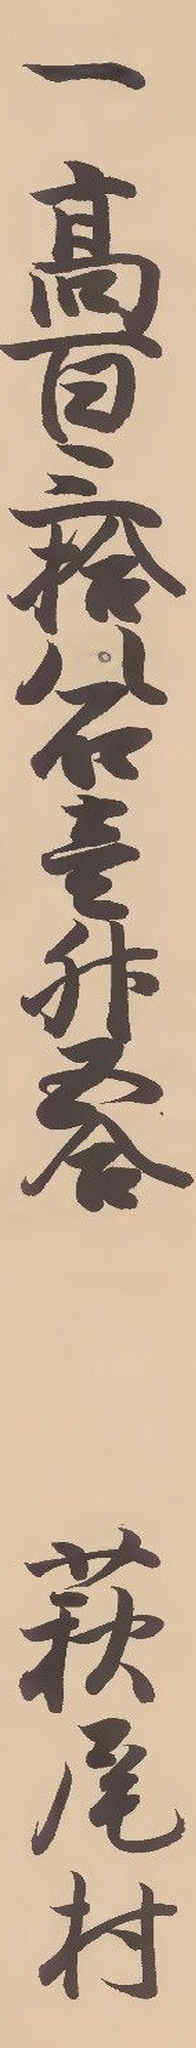一高百三拾八石壱升五合萩尾村
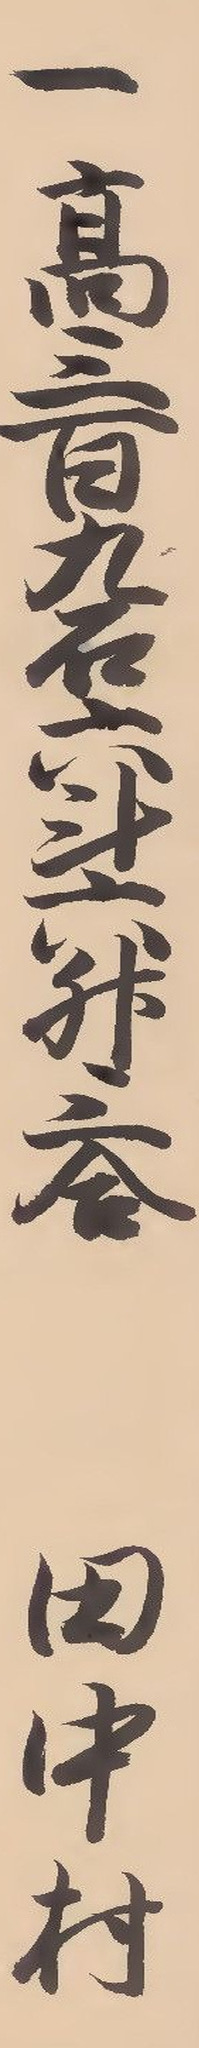一高三百九石六斗六升三合田中村
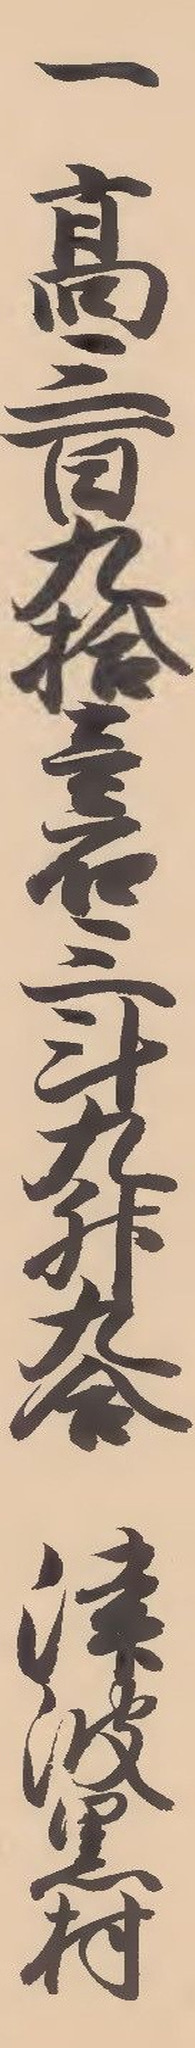一高三百九拾壱石三斗九升九合津波黒村
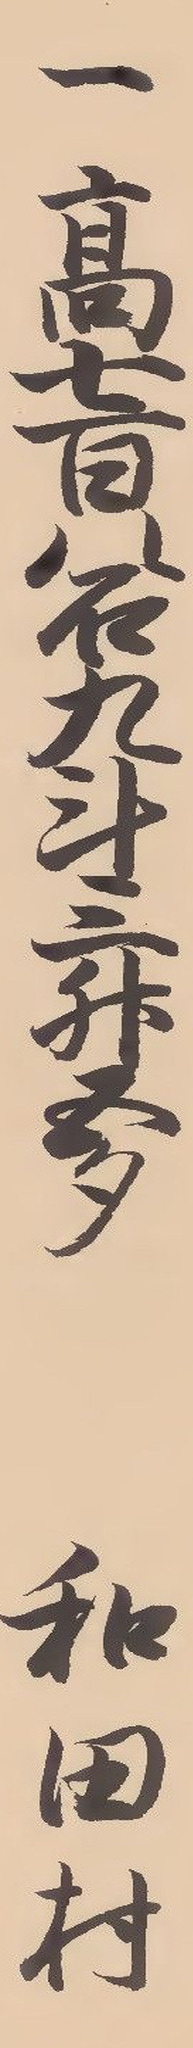一高七百八石九斗三升五勺和田村
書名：筑前国郷帳
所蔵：国立公文書館 National Archives of Japan
